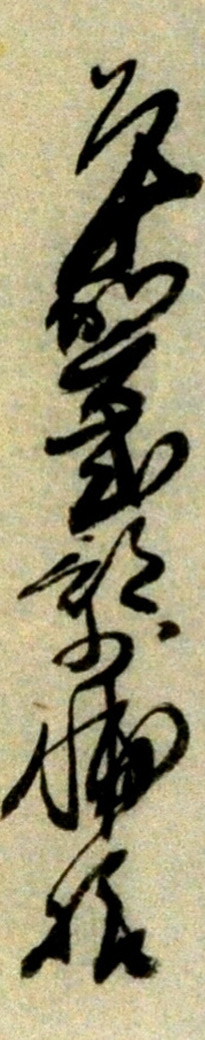平賀式部少輔様
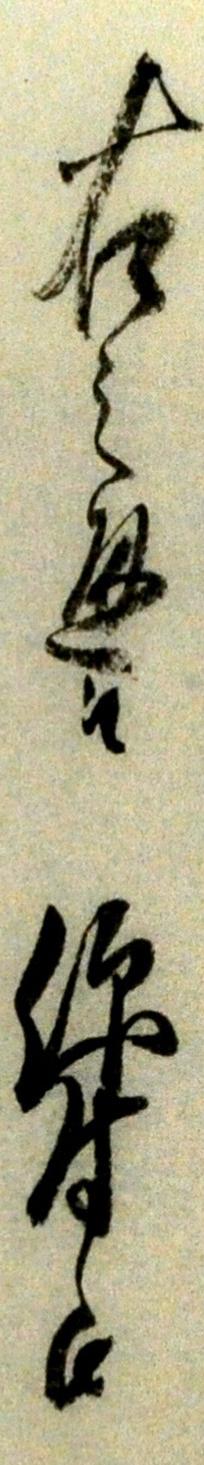右之通被仰付候由
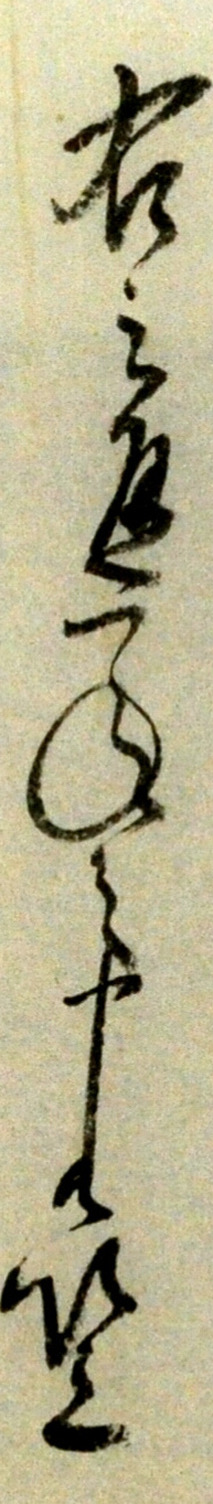右之通承之申候以上
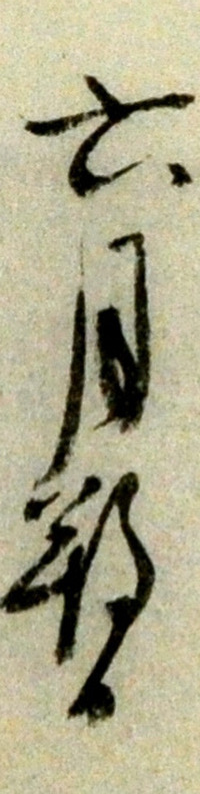六月朔日
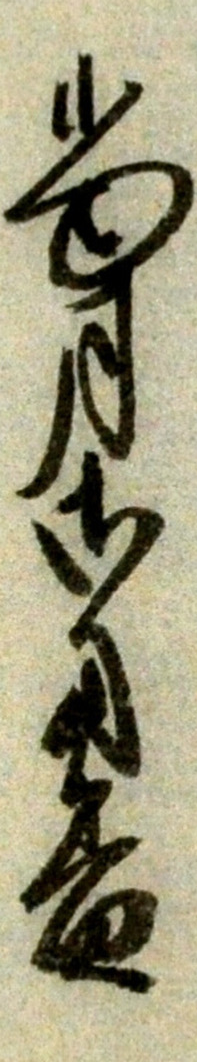当月御用番

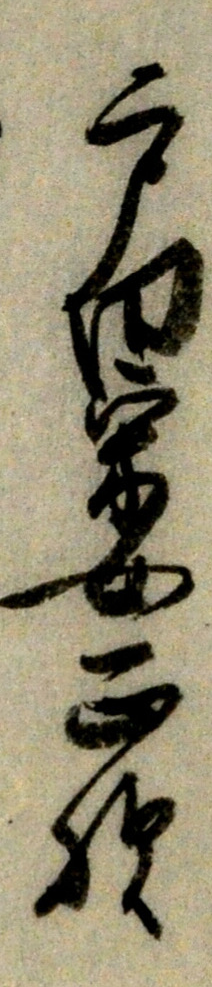戸田采女正様
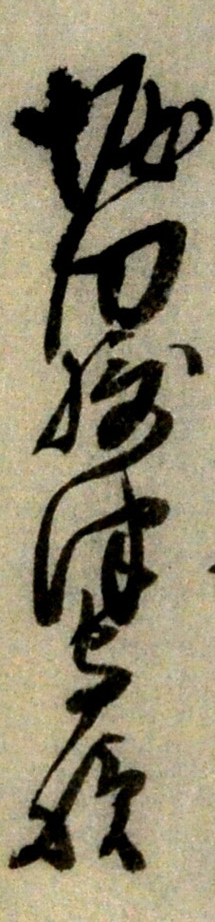堀田摂津守様
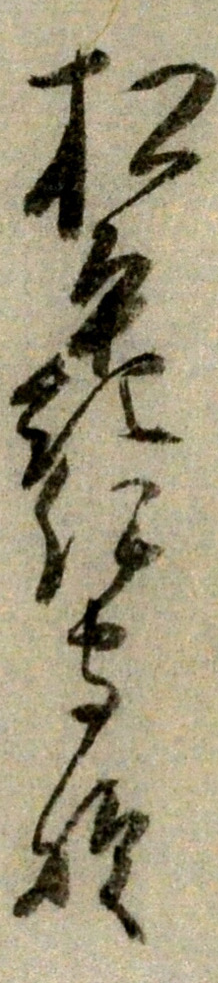松平紀伊守様
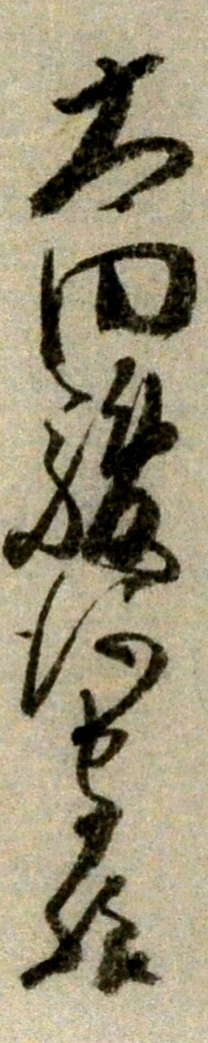太田駿河守様
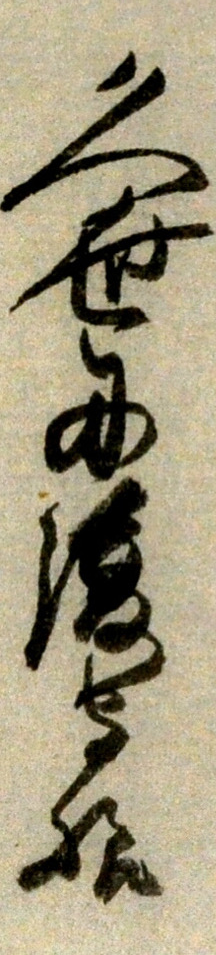久世丹後ｍ守様
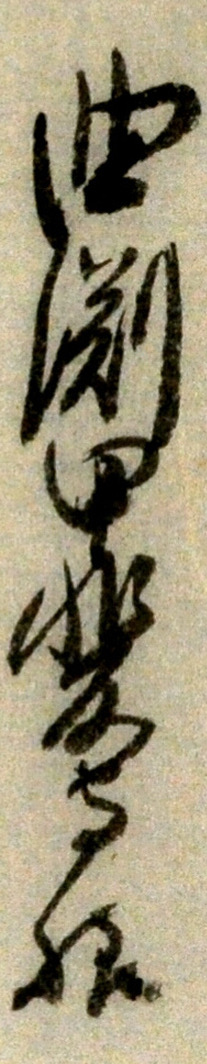曲渕甲斐守様
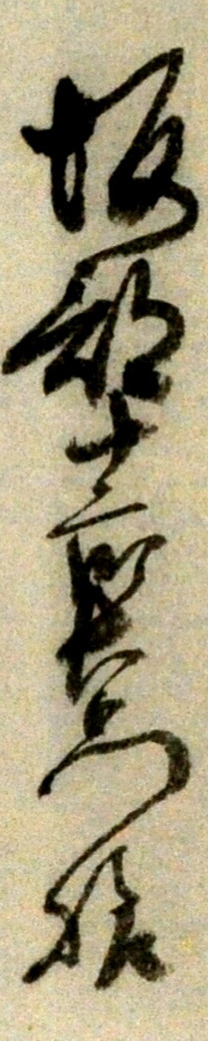坂部十郎右衛門様
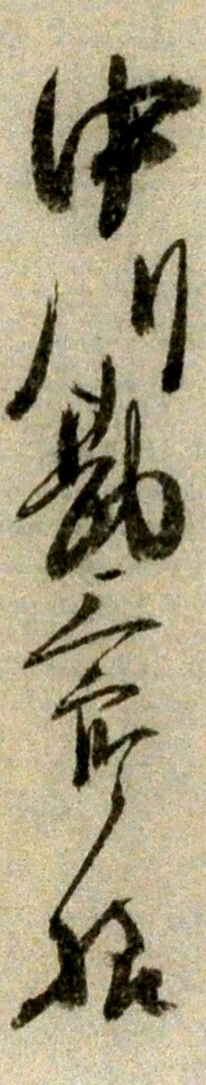中川勘三郎様
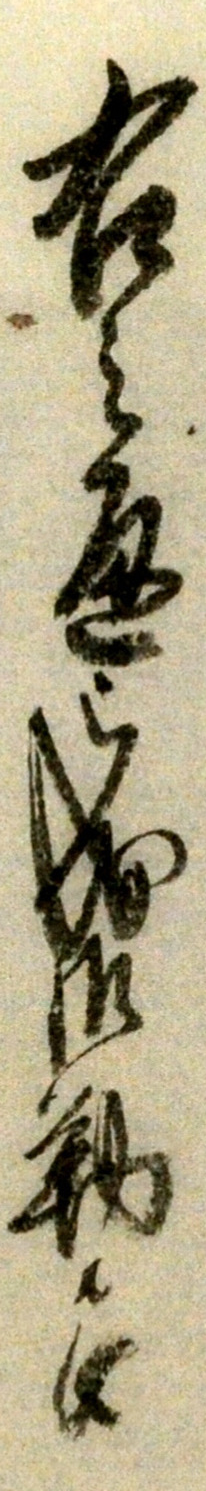右之通被成御勤候由
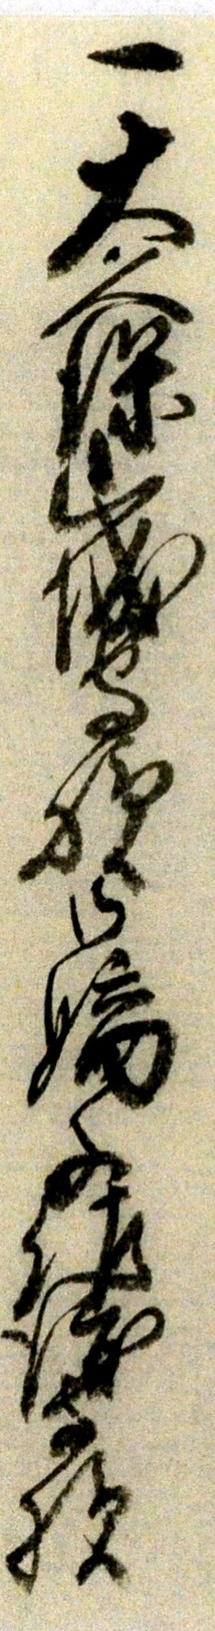一大久保山城守様御嫡子佐渡守様
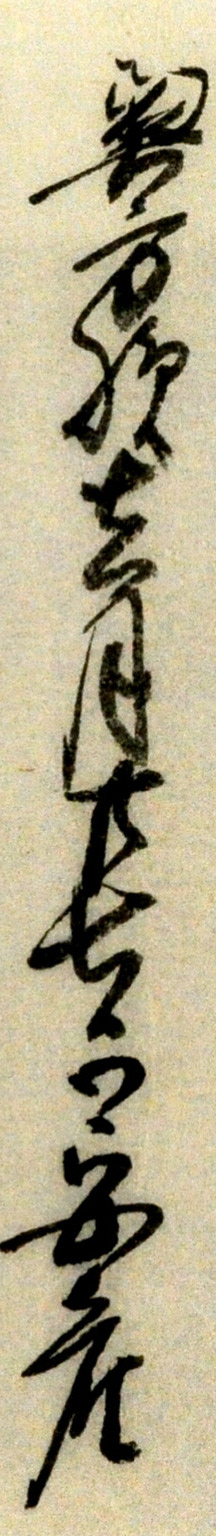奥方様去月廿七日御安産
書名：申合帳〔一括〕
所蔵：伊那市立高遠町図書館・合同会社AMANE
